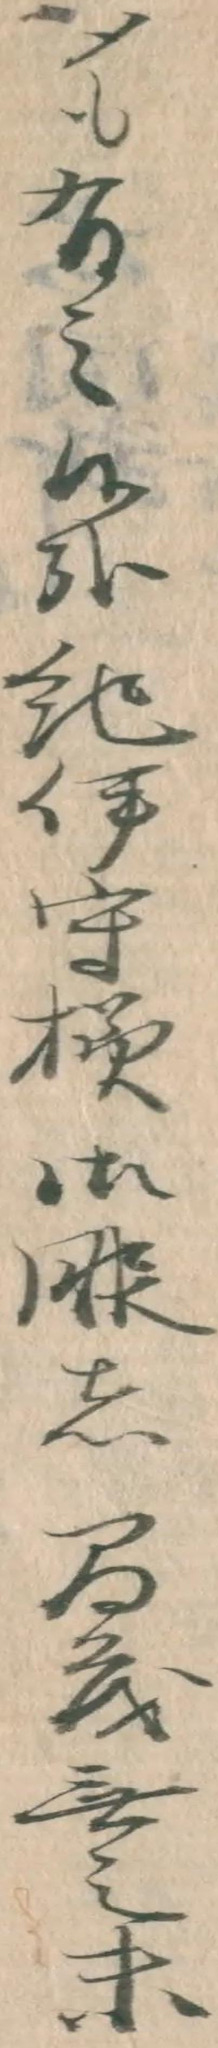しても有之候哉紀伊守様御服者間茂無之未
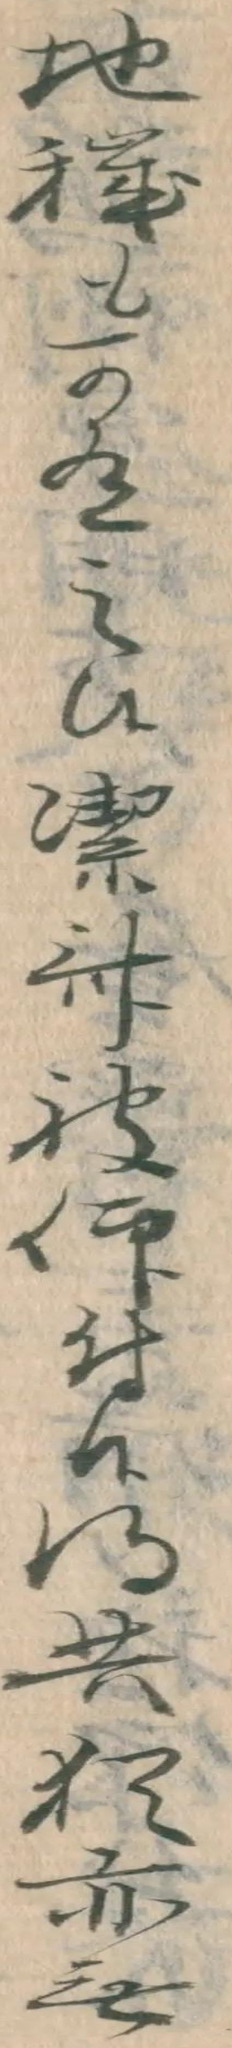地穢も可有之候潔斎被仰付候得共猶亦無
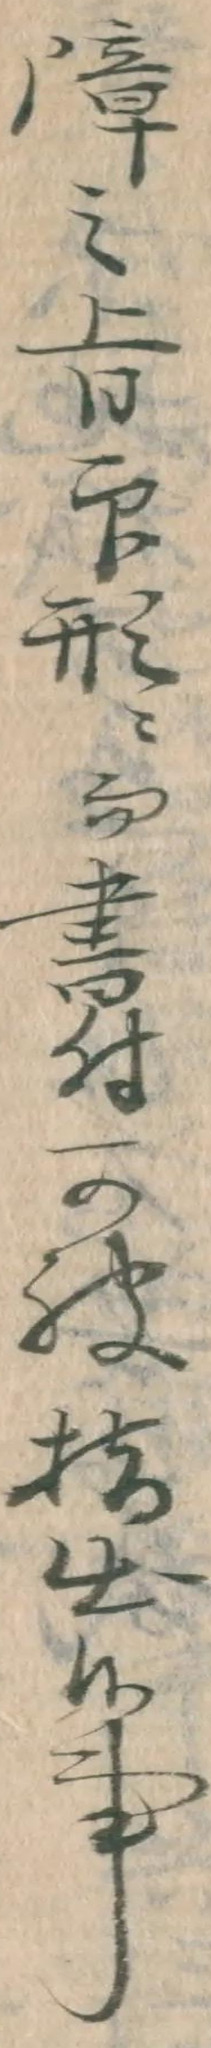障之旨印形ニ而書付可被指出候事
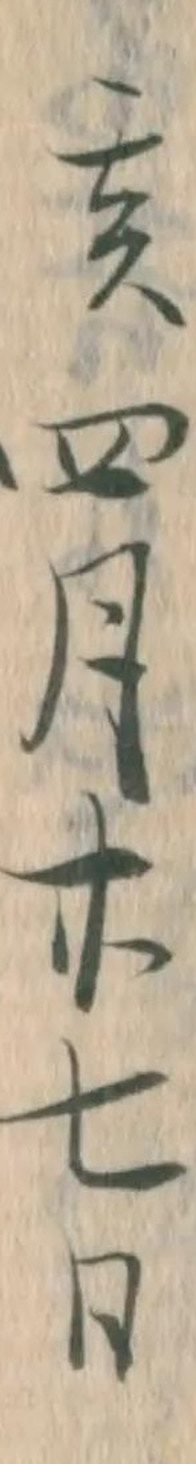亥四月廿七日
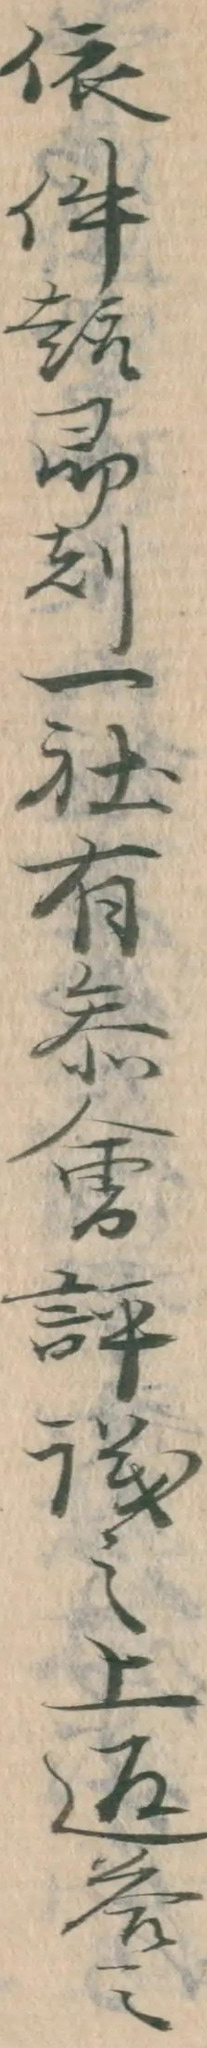依件趣即刻一社有参会評議之上返答之
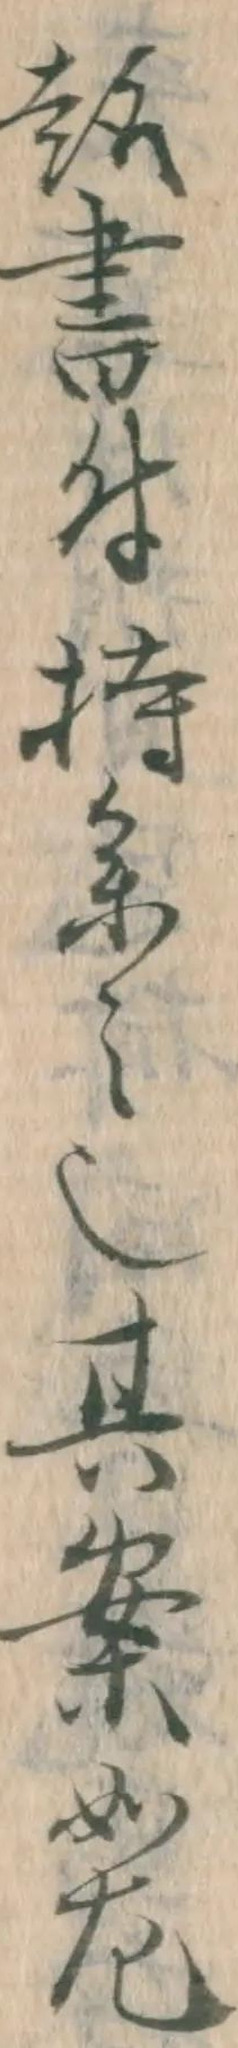趣書付持参之也其案如左
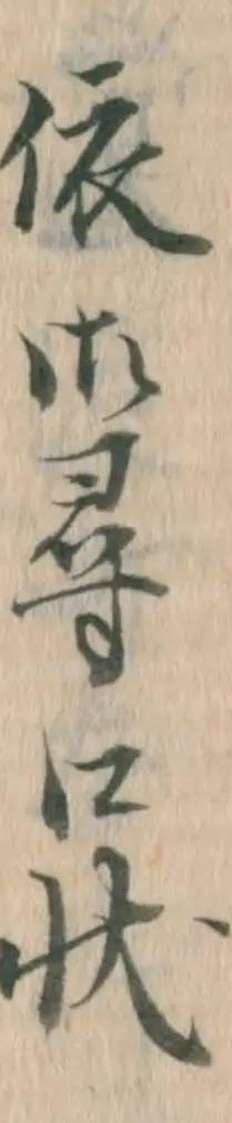依御尋口状
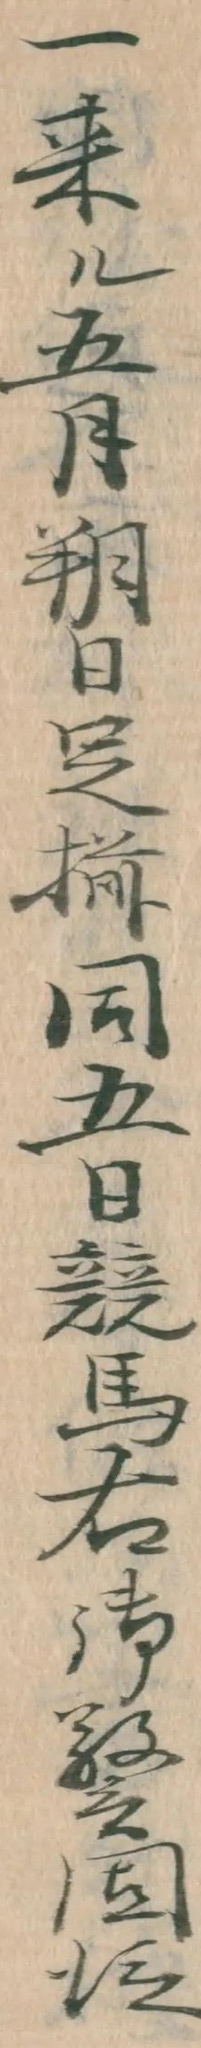一来ル五月朔日足揃同五日競馬右御警固従
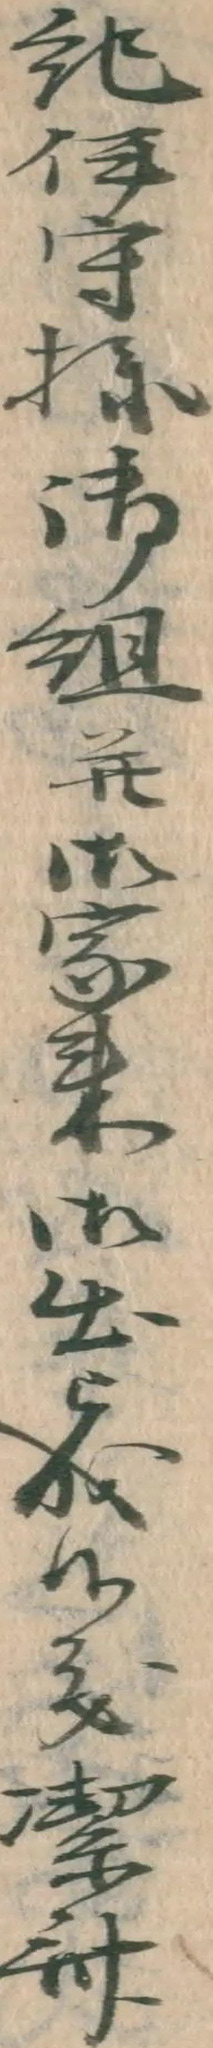紀伊守様御組并御家来御出被成候義潔斎
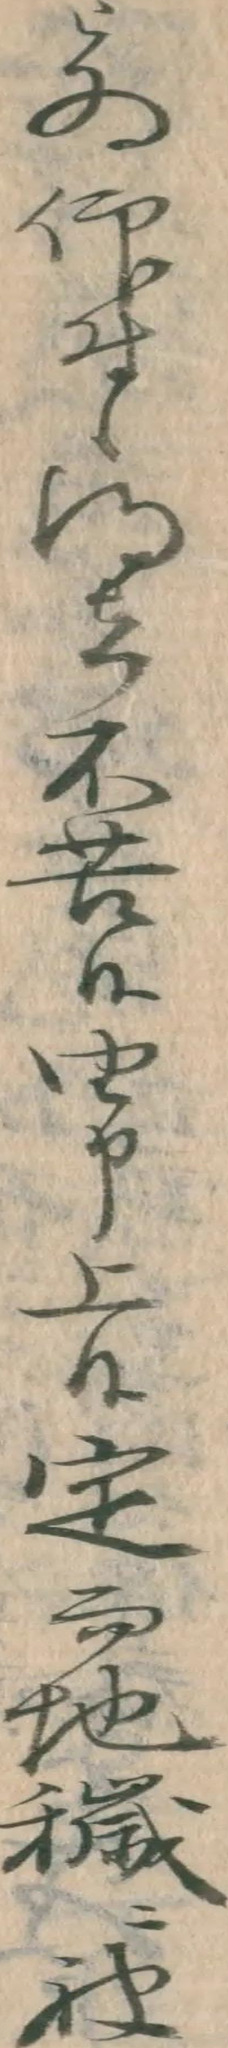被為仰付候得者不苦候由申上候定而地穢ニ被
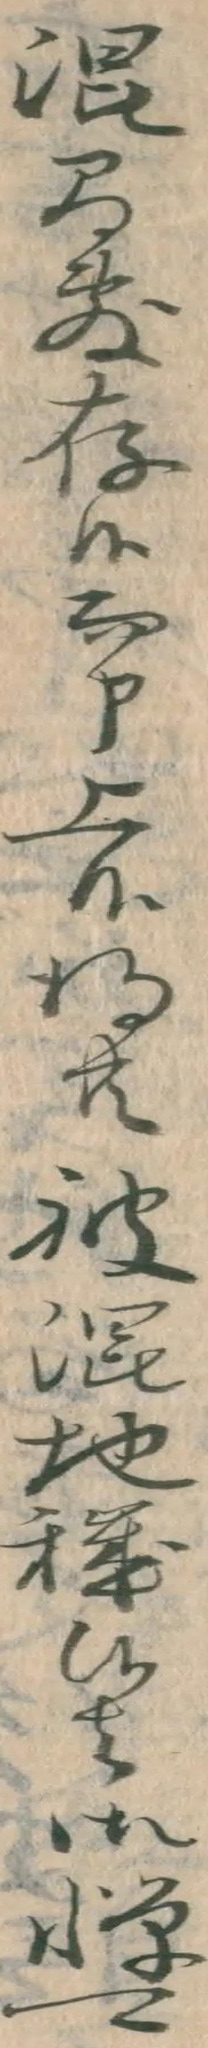混間敷存候而申上候得共被混地穢候者御憚可
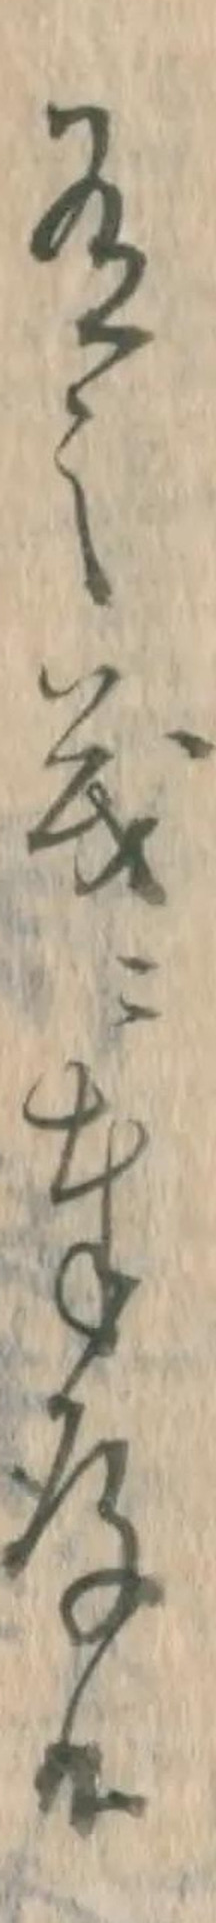有之義ニ奉存候
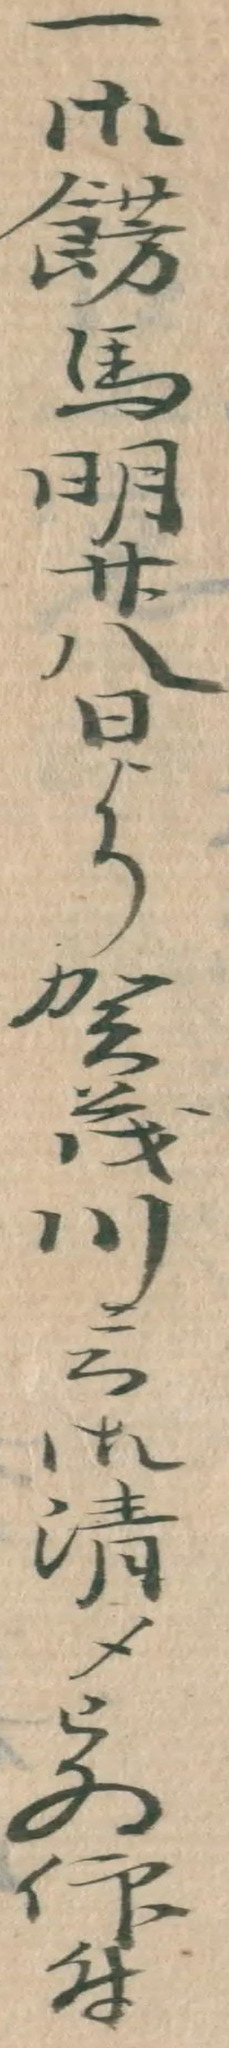一御餝馬明廿八日より賀茂川ニ而御清シテ被為仰付
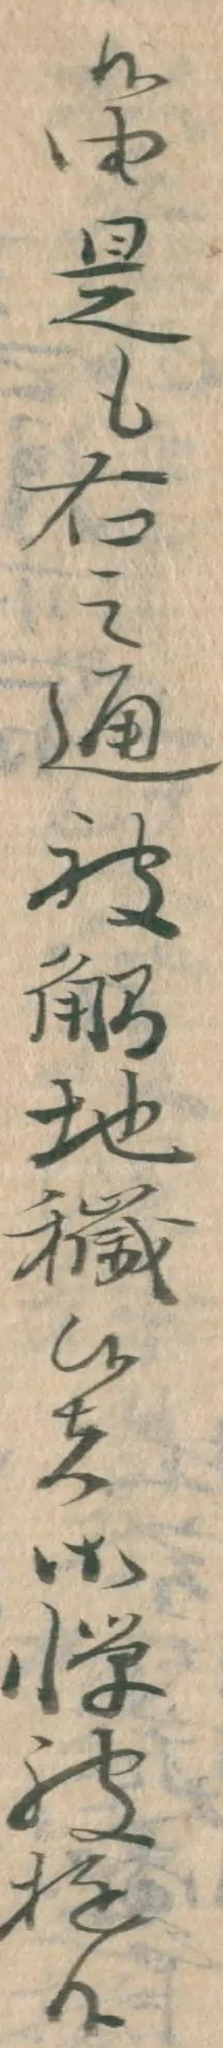候由是も右之通被触地穢候者御憚被遊候
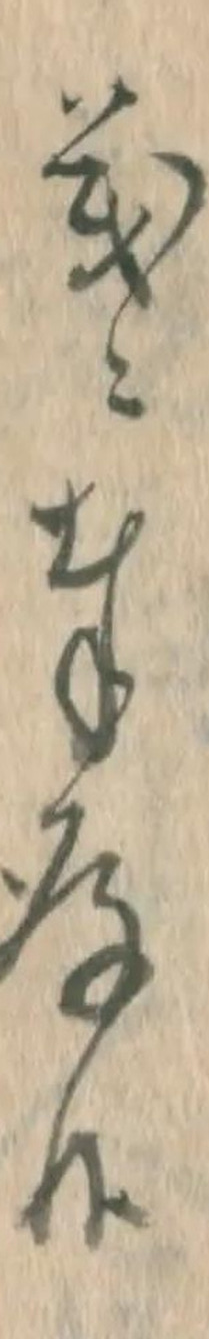義ニ奉存候
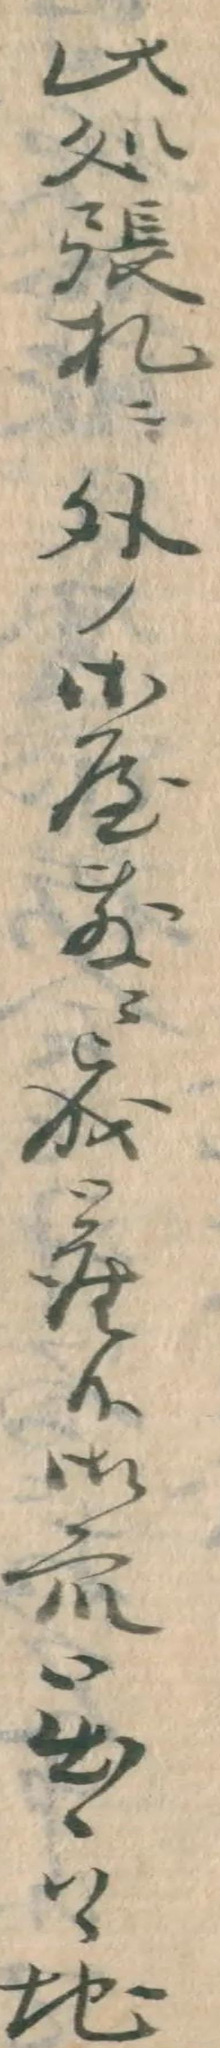此処張札ニ外ノ御屋敷ニ被成御座候御衆御出候ハヽ地
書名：賀茂社記録. 第10冊
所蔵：国立国会図書館 National Diet Library, JAPAN
